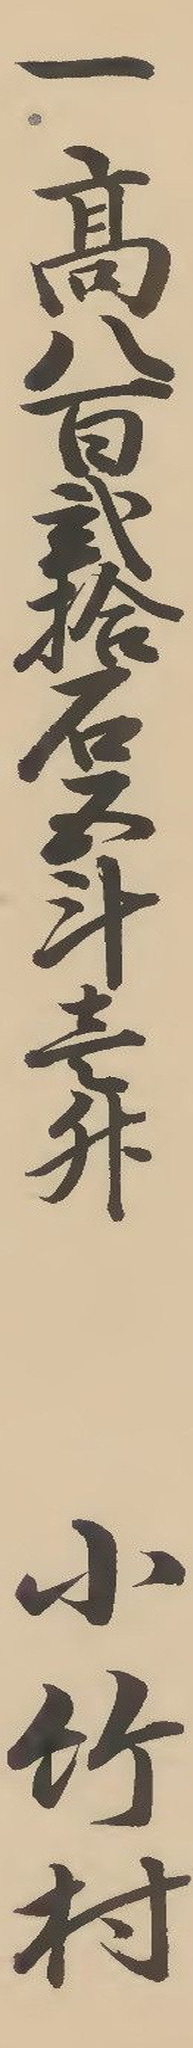一高八百弐拾石五斗壱升小竹村
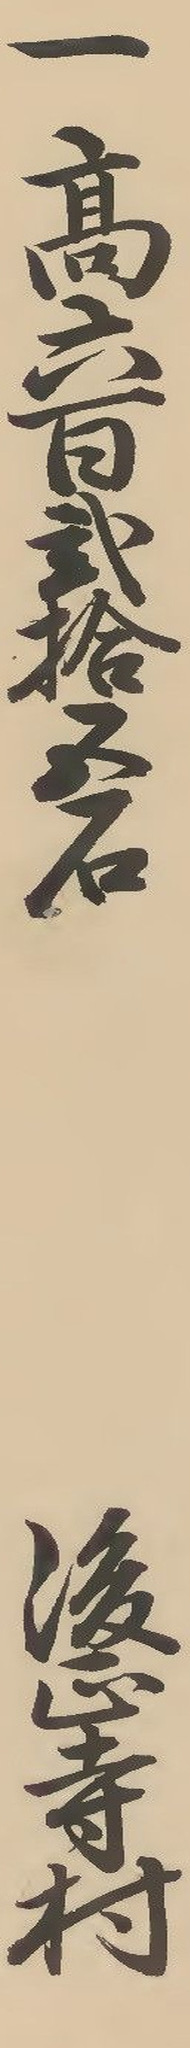一高六百弐拾五石後正寺村

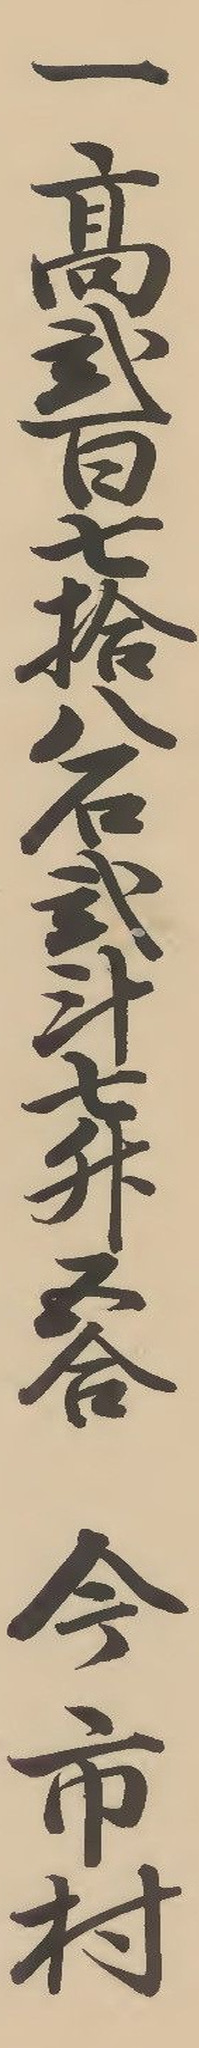一高弐百七拾八石弐斗七升五合今市村
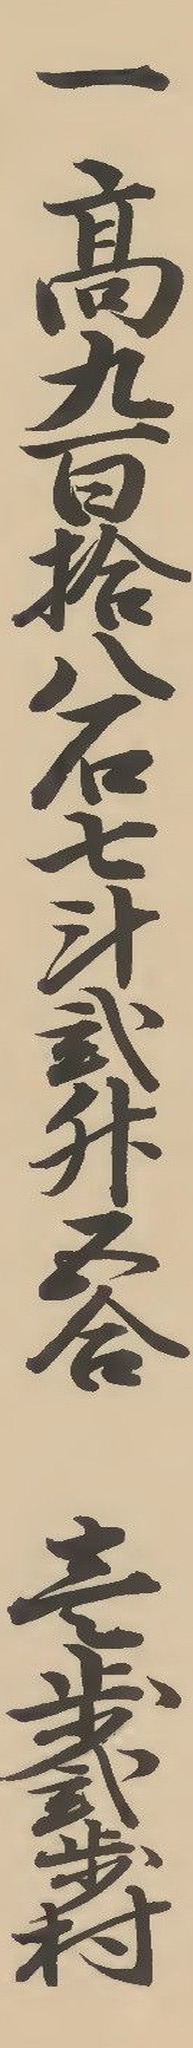一高九百拾八石七斗弐升五合壱歩弐歩村
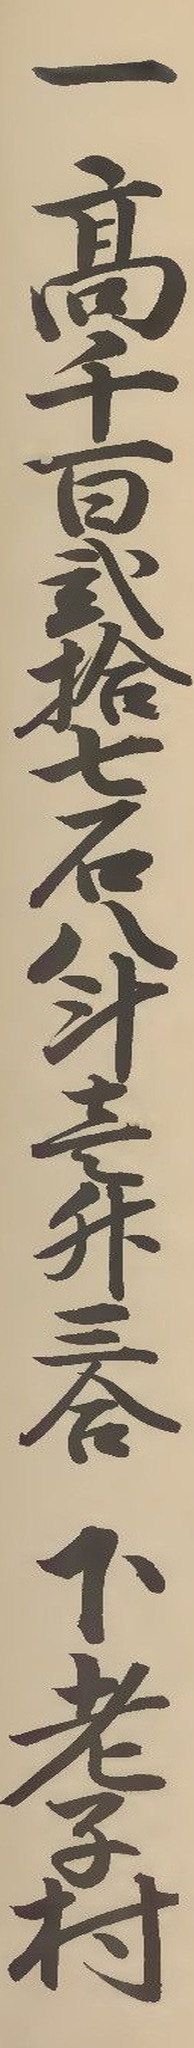一高千百弐拾七石八斗壱升三合下老子村
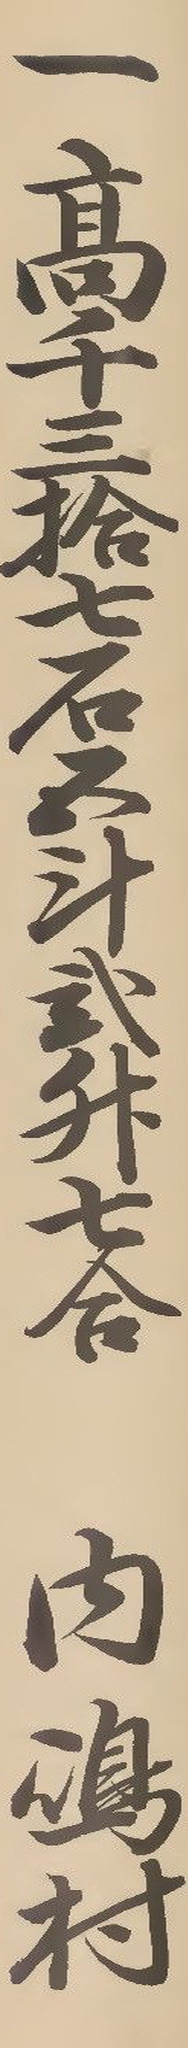一高千三拾七石五斗弐升七合内島村
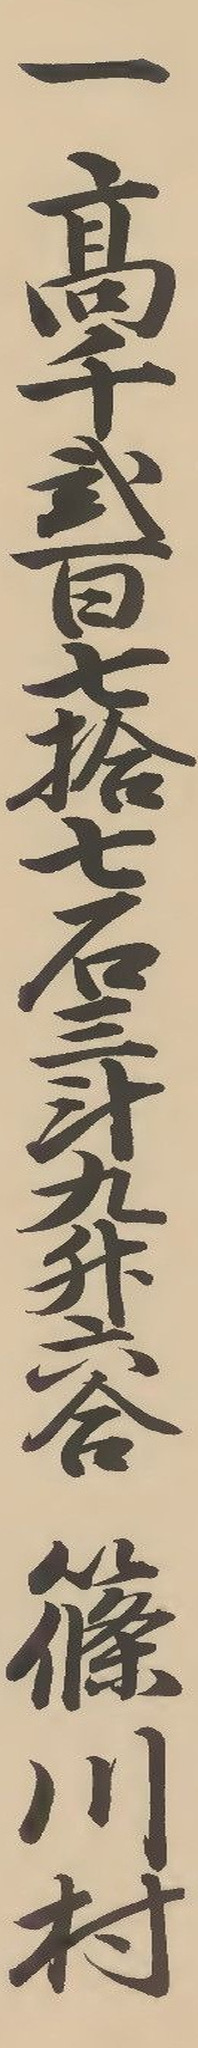一高千弐百七拾七石三斗九升六合篠川村
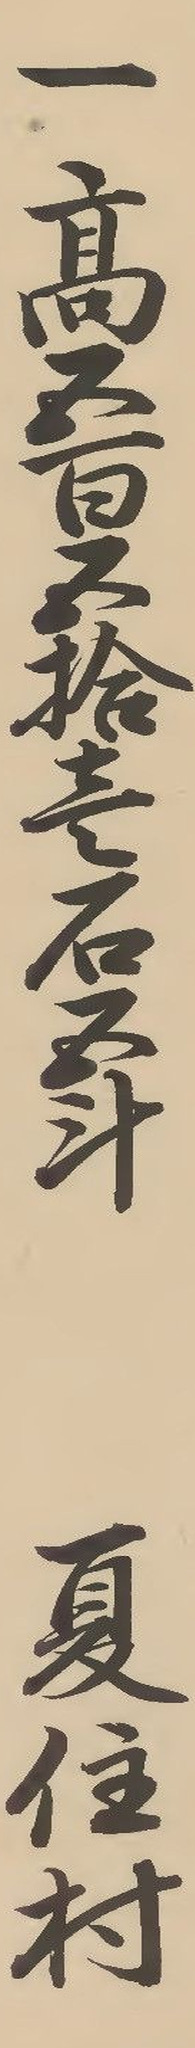一高五百五拾壱石五斗夏住村
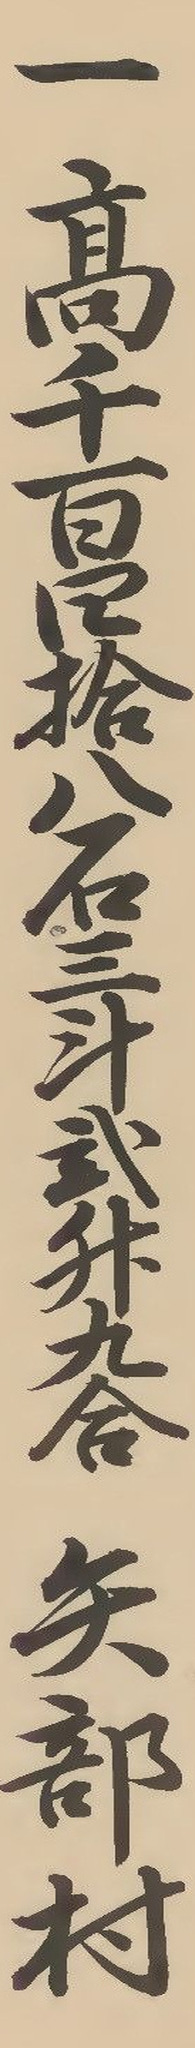一高千百四拾八石三斗弐升九合矢部村

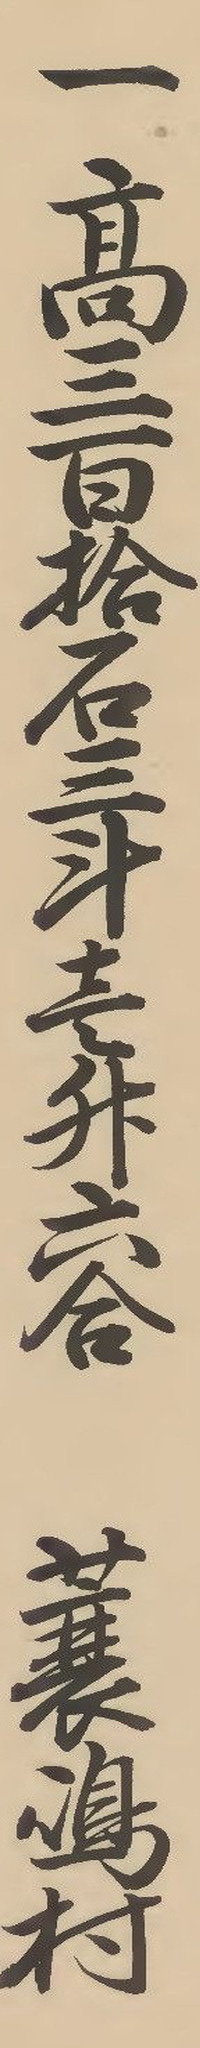一高三百拾石三斗壱升六合蓑島村
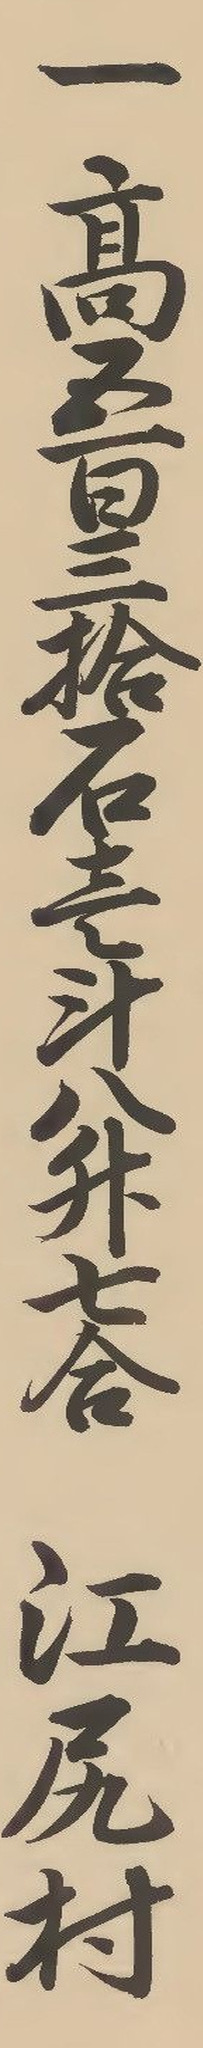一高五百三拾石壱斗八升七合江尻村
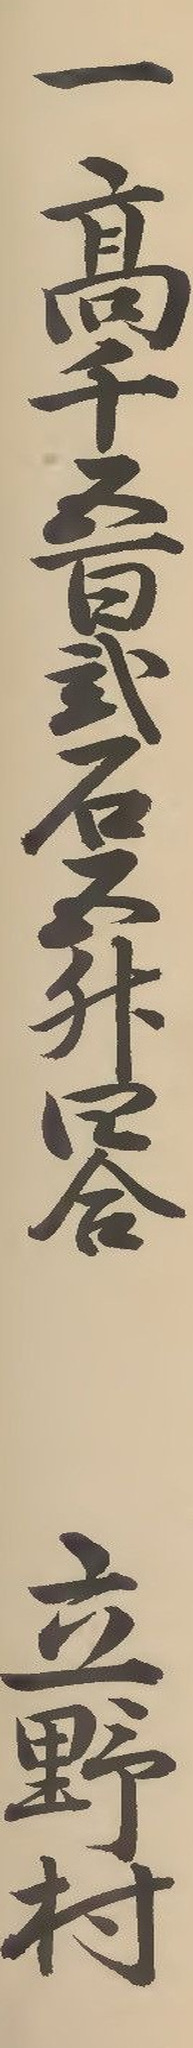一高千五百弐石五升四合立野村
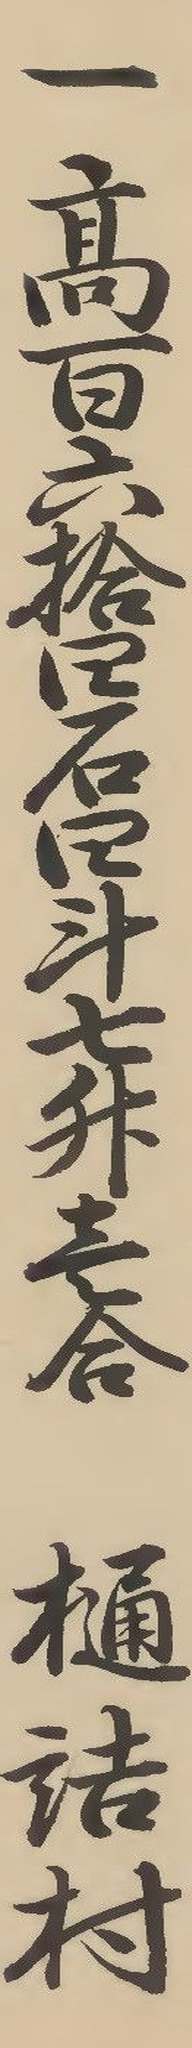一高百六拾四石四斗七升壱合樋詰村
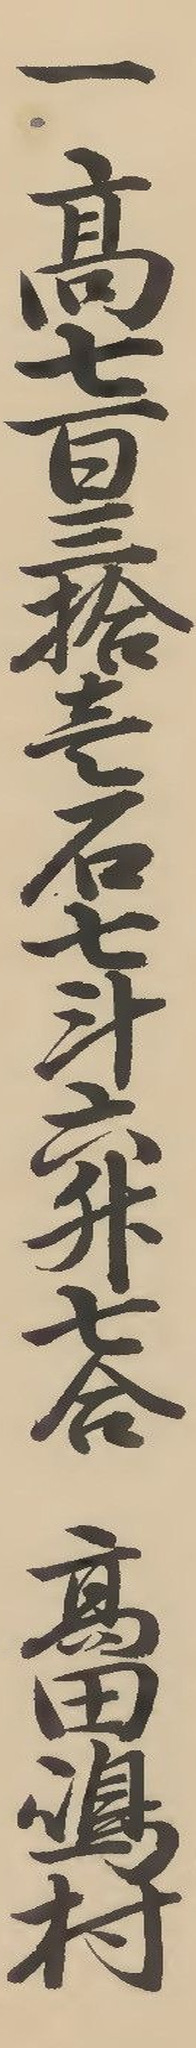一高七百三拾壱石七斗六升七合高田島村
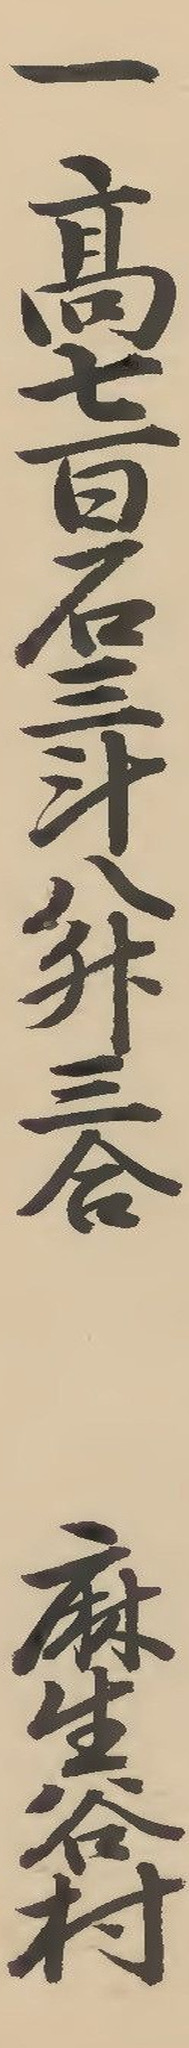一高七百石三斗八升三合麻生谷村

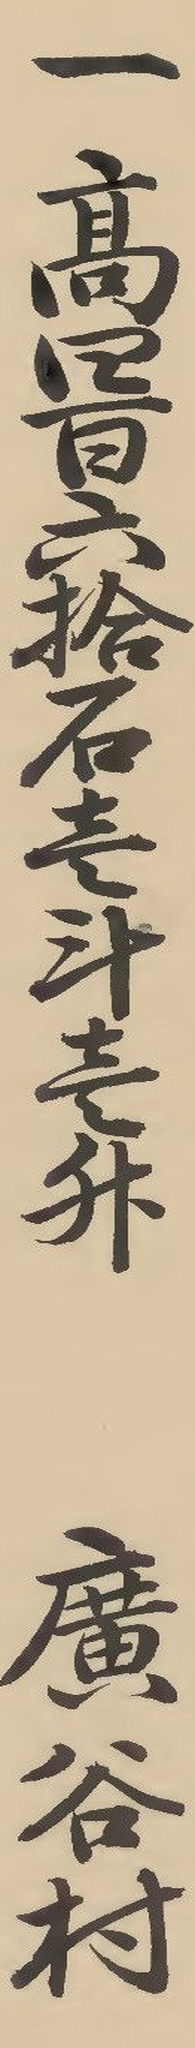一高四百六拾石壱斗壱升広谷村
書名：越中国郷帳
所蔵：国立公文書館 National Archives of Japan
